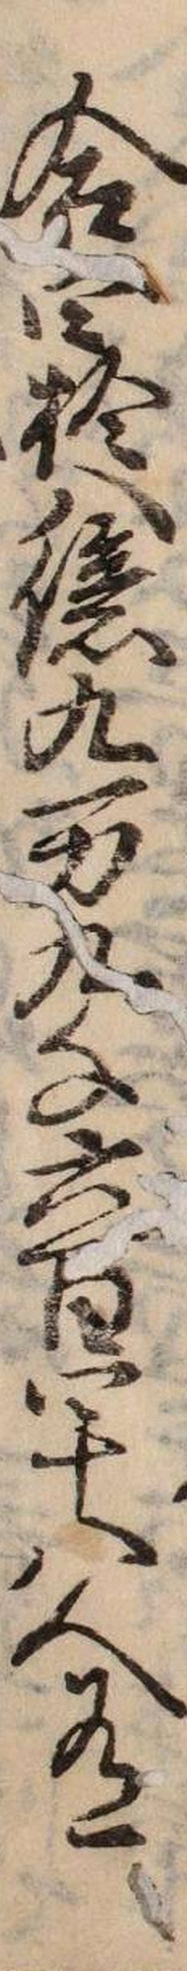合四拾八億九万九千六百四十八人有
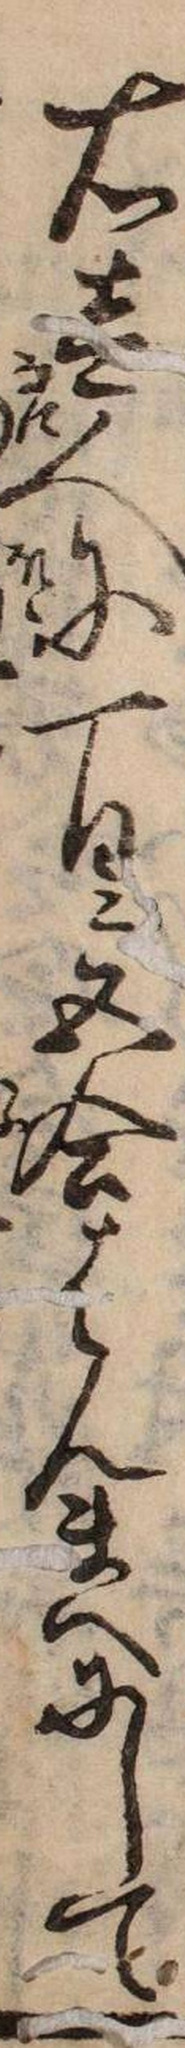右壱人に百に五合はんまへにして
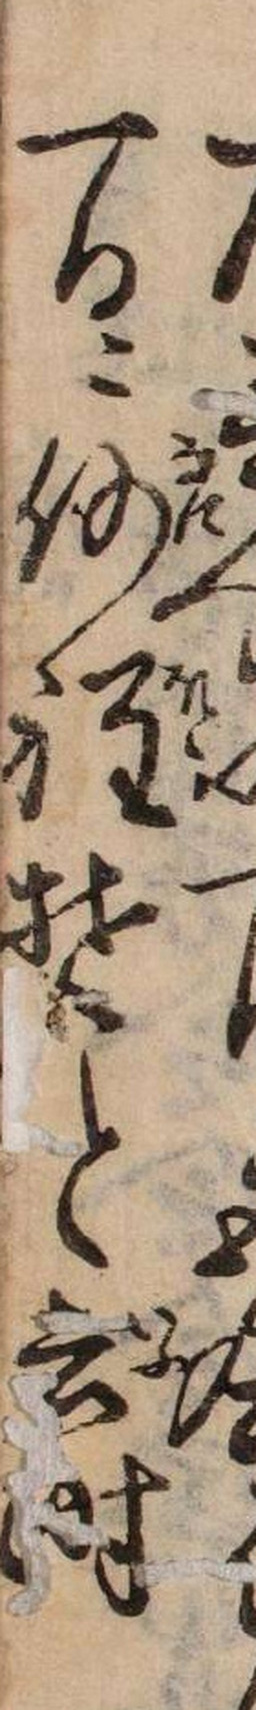百に何程そと云時

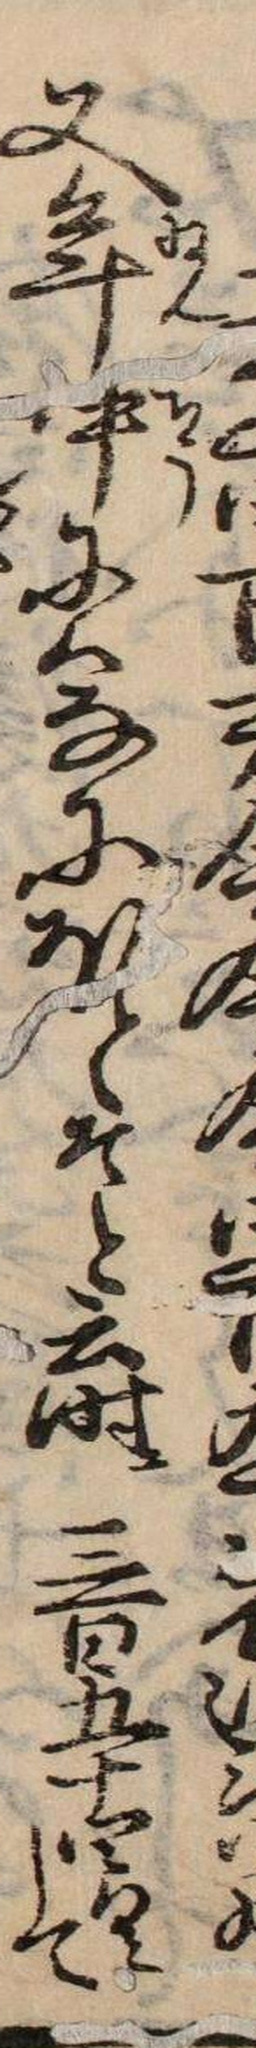又年中にはなにほとそと云時に三百五十四日にして
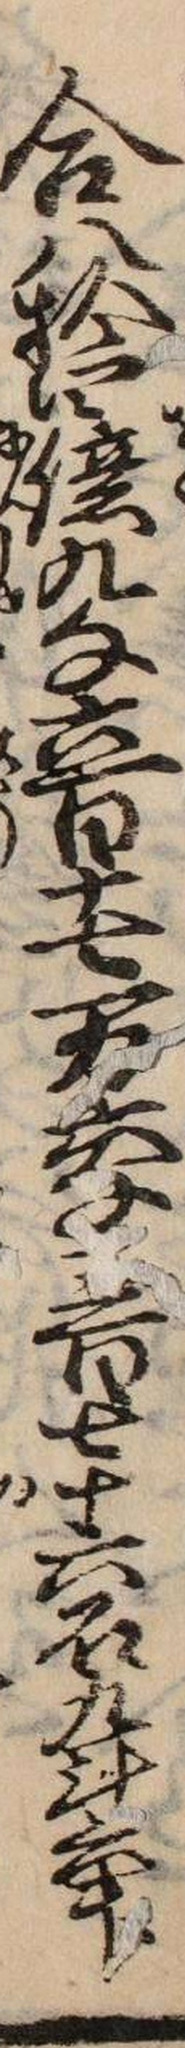合八拾四億九千六百十七万六千三百七十六石九斗六升
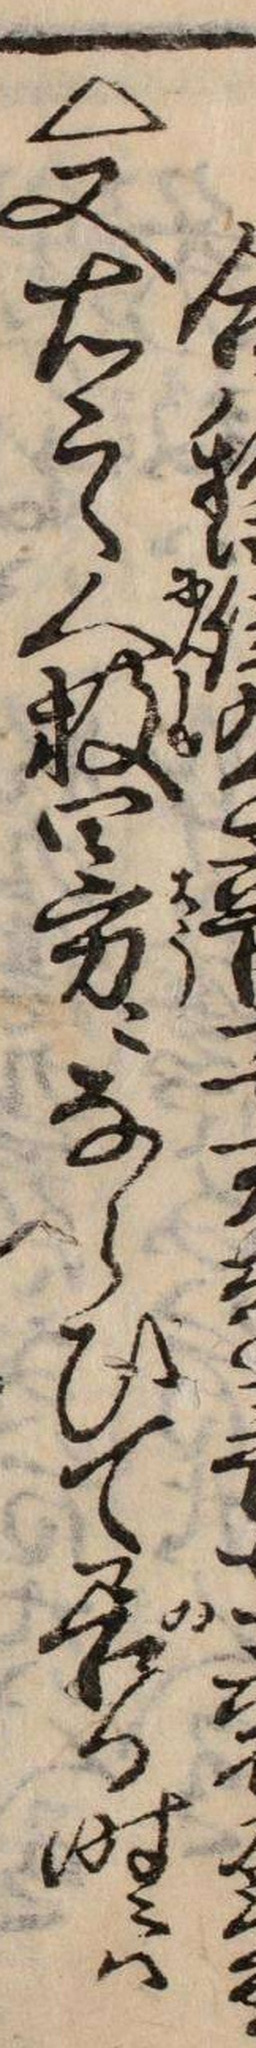△又右之人数四方にならひて居る時には
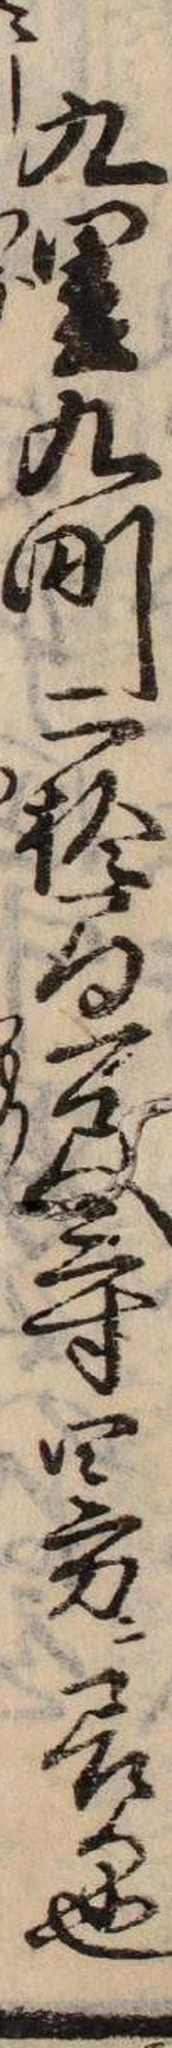九里九町二拾間一尺三寸四方に居る也
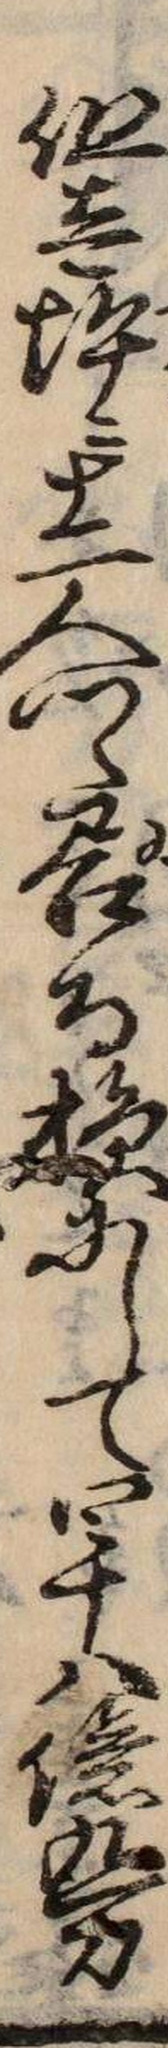但壱坪に十二人つつ居る積にして四十八億九万
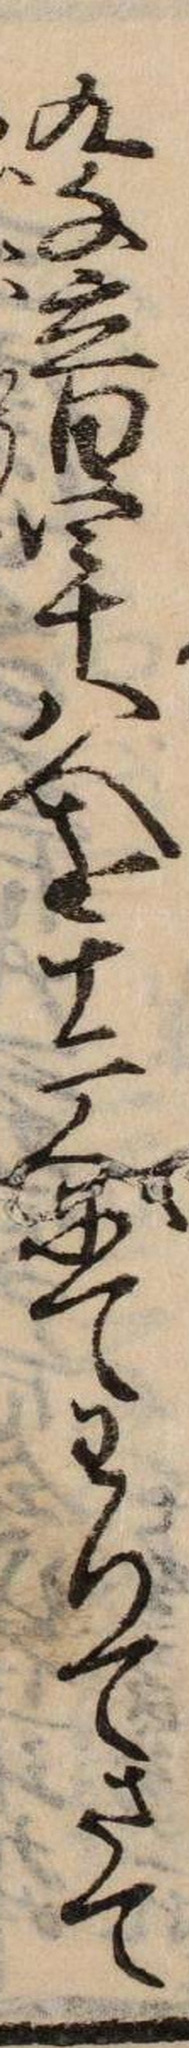九千六百四十八人を十二人にてわりてさて
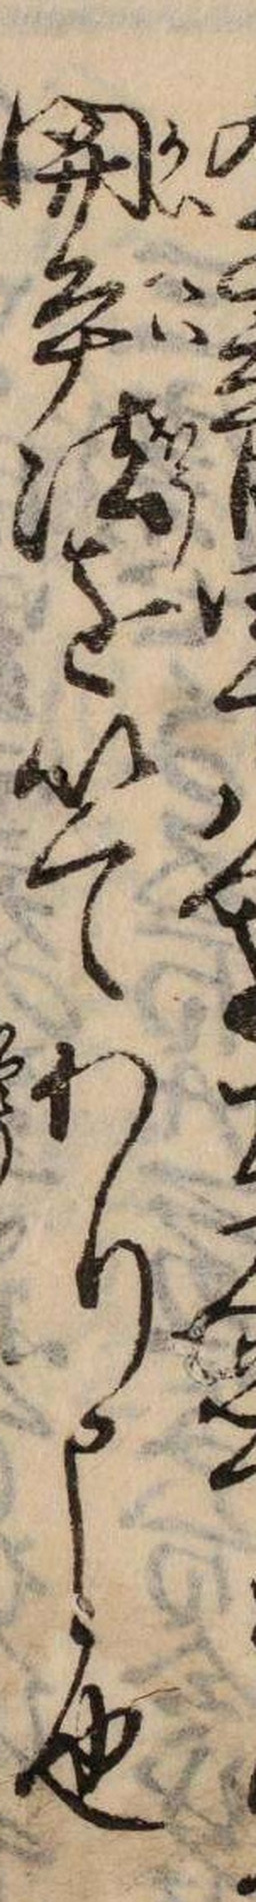開平法を以てわり申候也
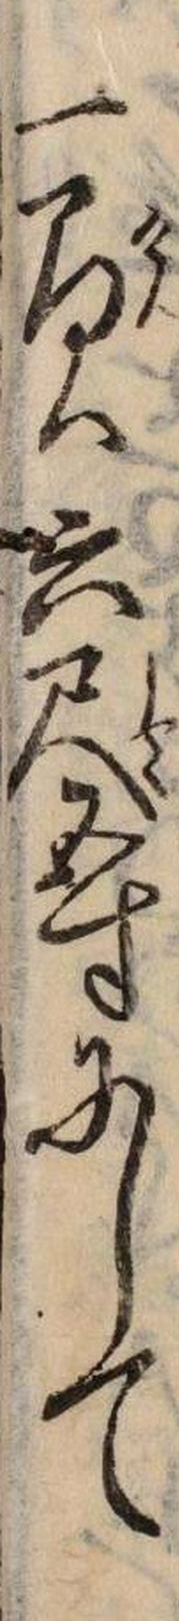一間は六尺五寸にして
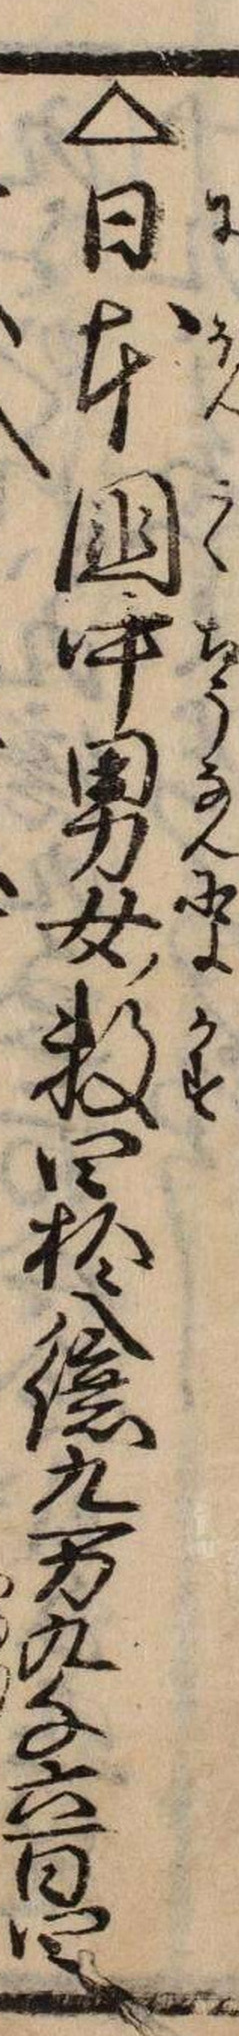△日本国中男女の数四拾八億九万九千六百四
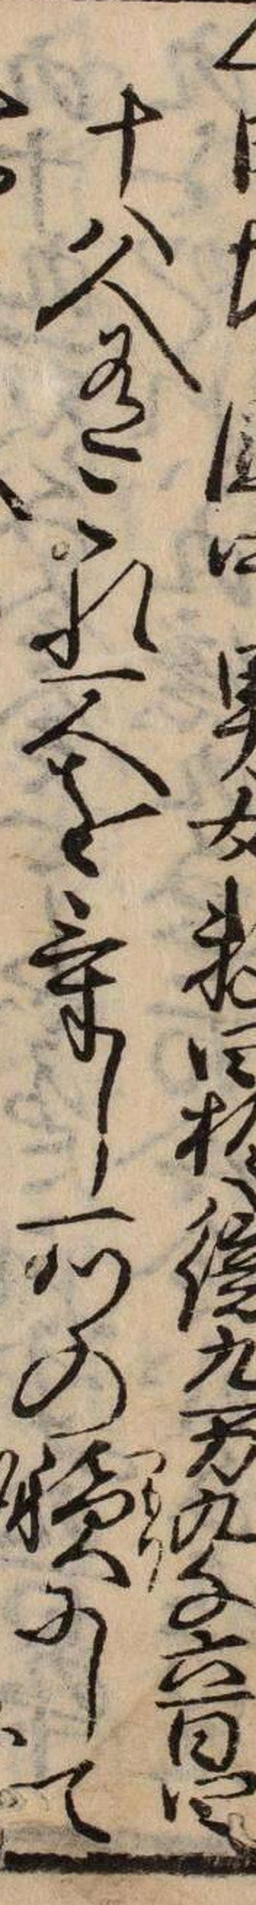十八人有これ一人をけし一つの積にして
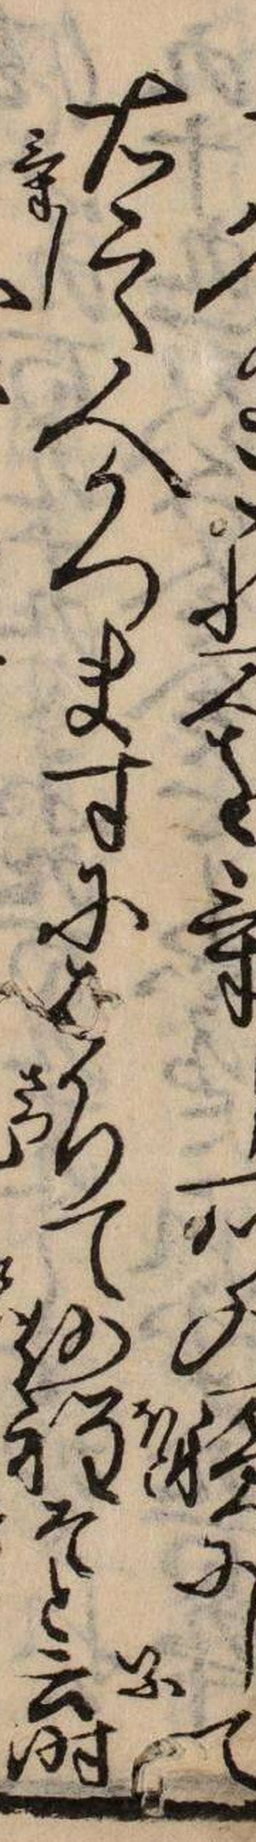右之人かつますにばかりて何程そと云時
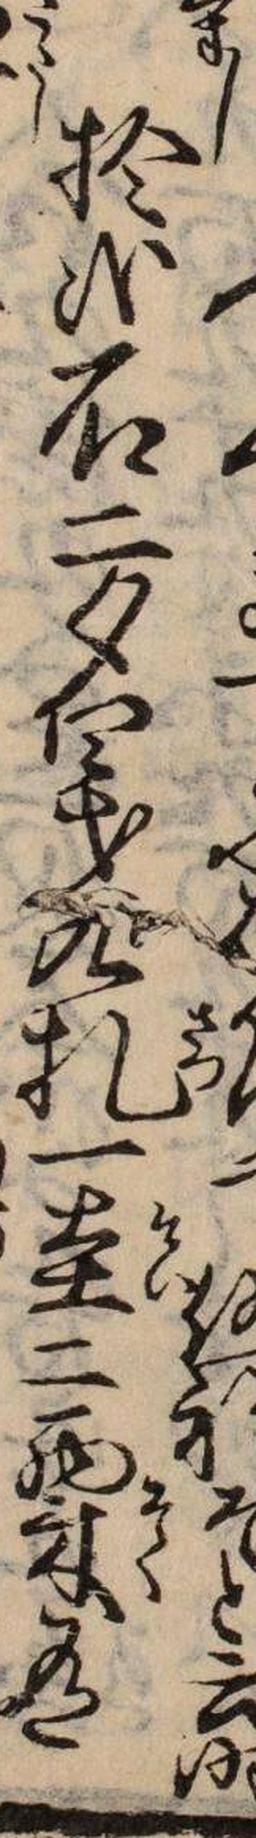けし拾弐石二勺四才九札一圭二粟有
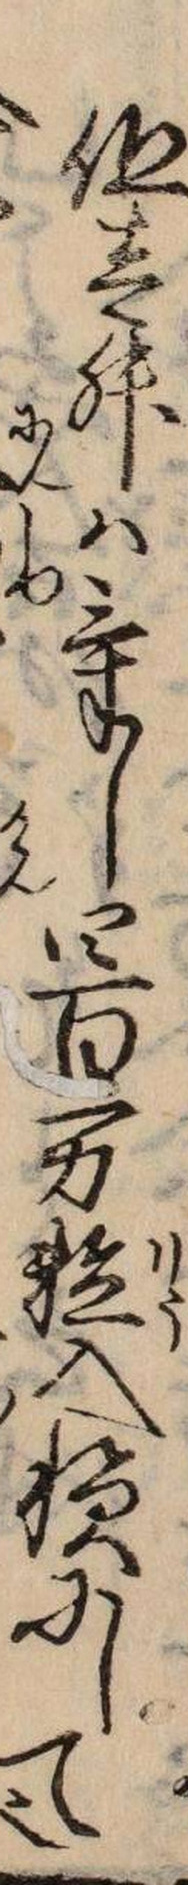但壱升はけし四百万粒入積にして也
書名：塵劫記（寛永11年自跋、京都府立京都学・歴彩館追貴8）
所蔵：京都府立京都学・歴彩館 国文学研究資料館
